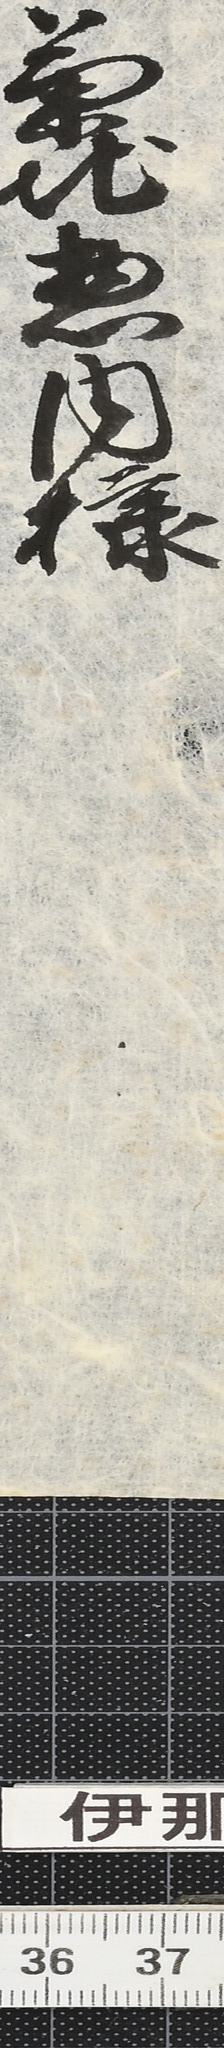菊地惣内様
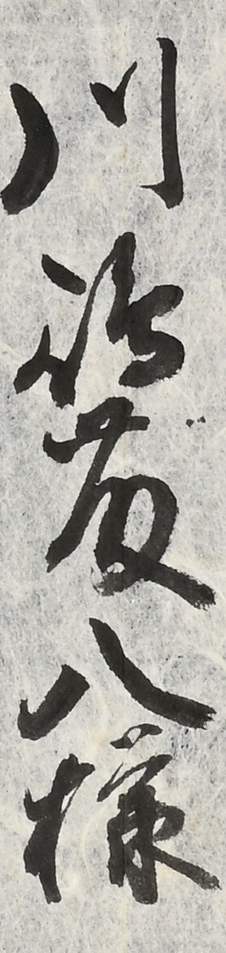川嶋藤八様

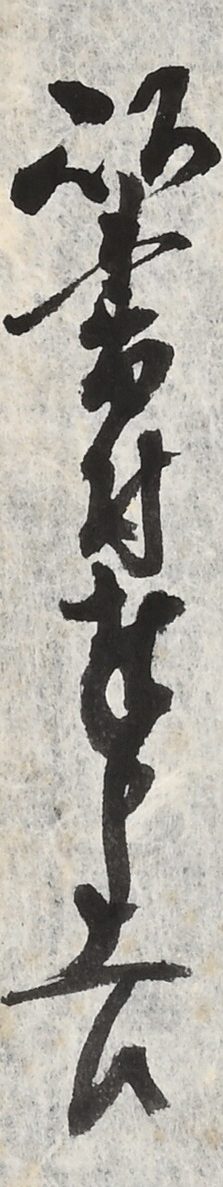以書付奉申上候
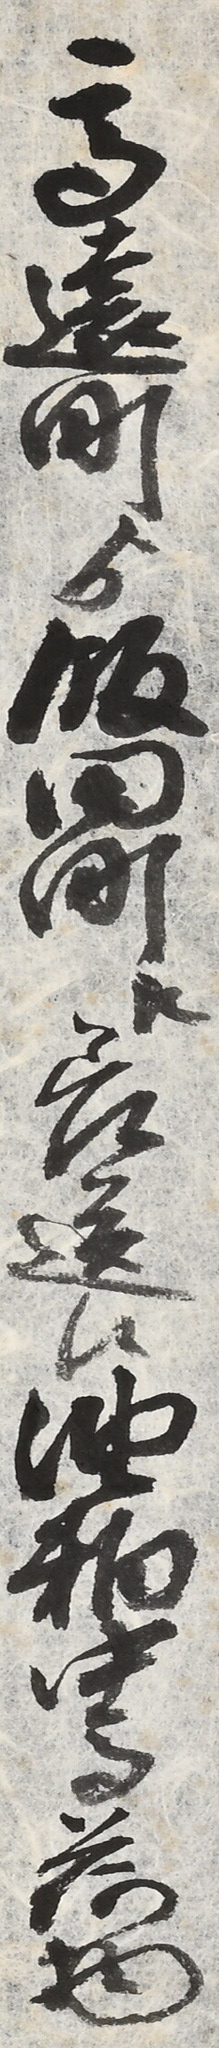高遠町ゟ飯田町江差送候油粕中馬荷物
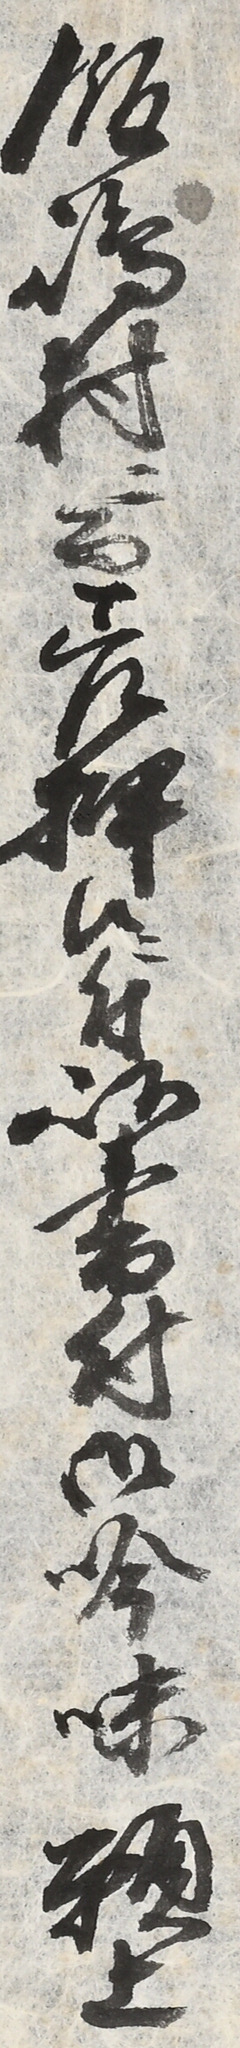飯嶋村ニ而差押候ニ付以書付候吟味願上
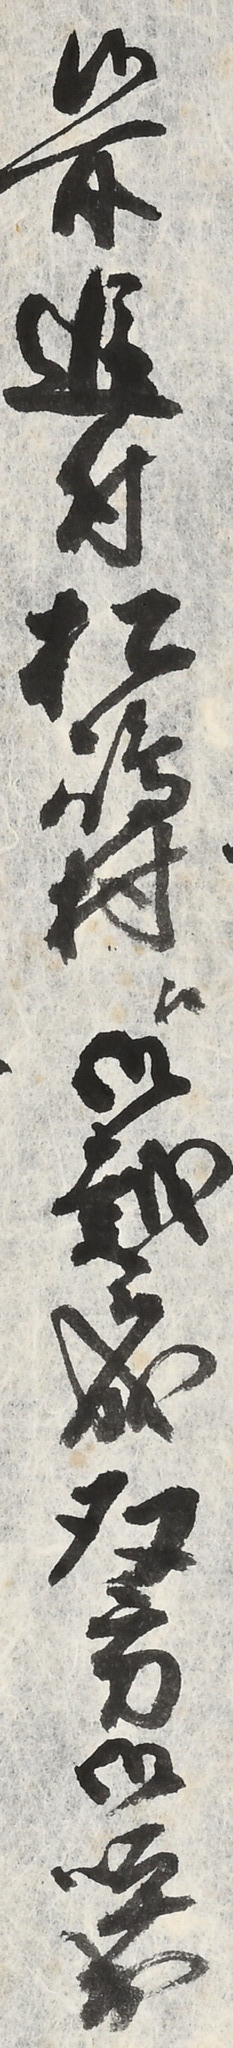候所追付松嶋村江御越被成双方御呼出
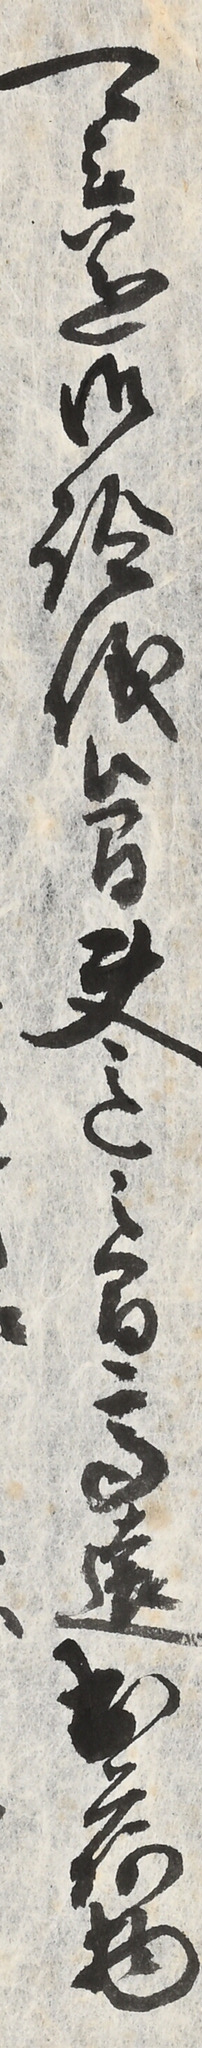可被遂御詮儀候間夫迄之間高遠出荷物
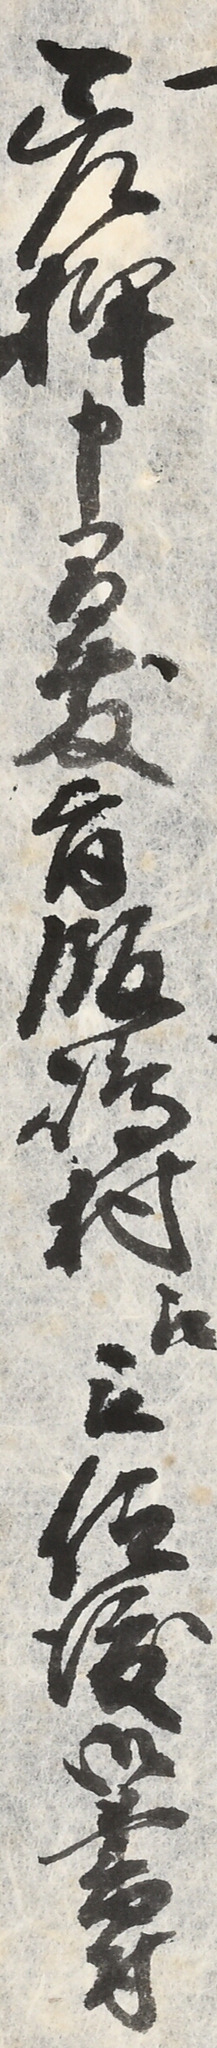差押申間敷旨飯嶋村江被仰渡御書付
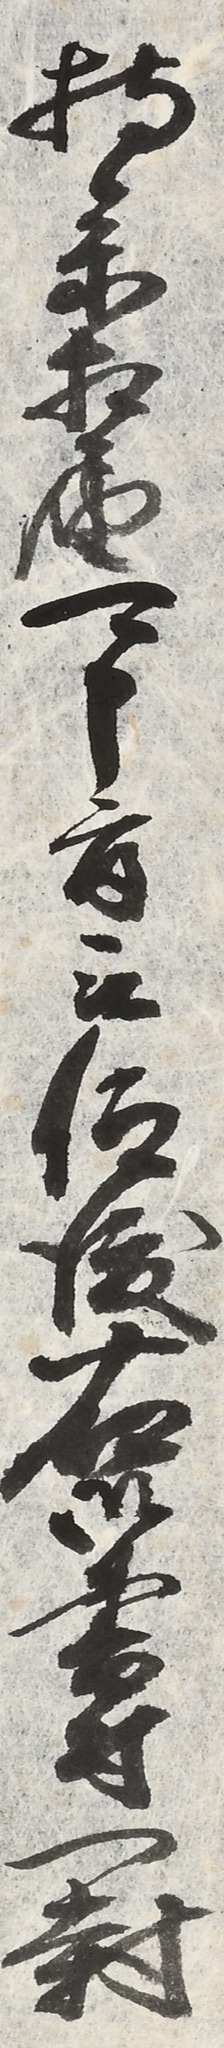持参相届可申旨被仰渡右御書付一封
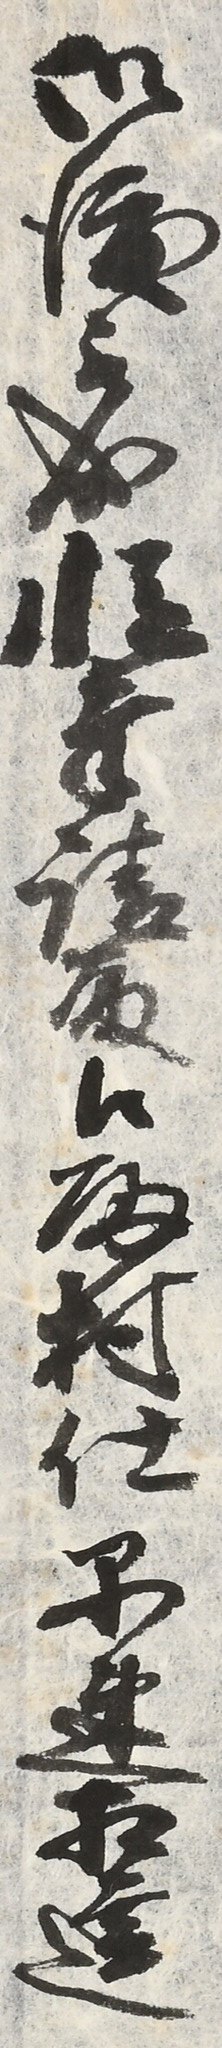御渡被成慥奉請取候帰村仕早速相違
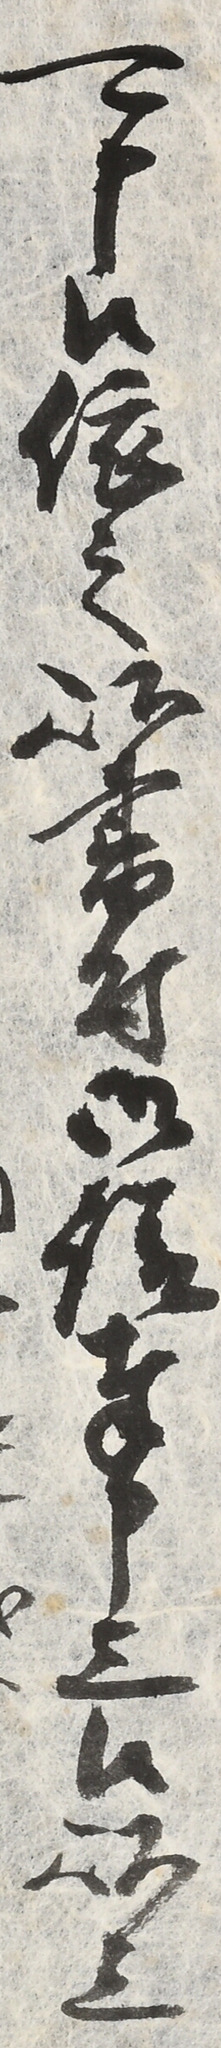可申候依之以書付御請奉申上候以上
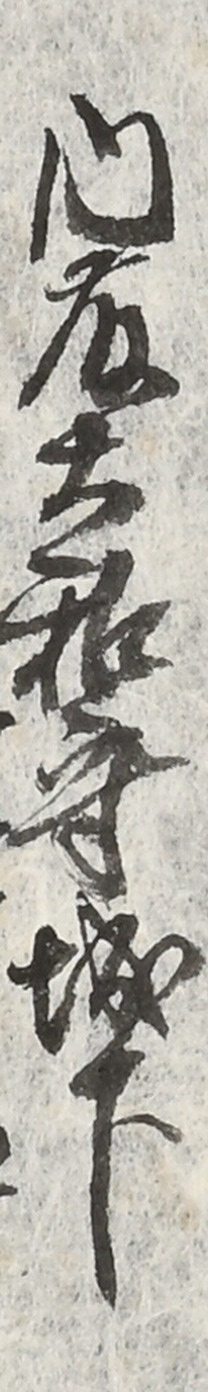内藤大和守城下
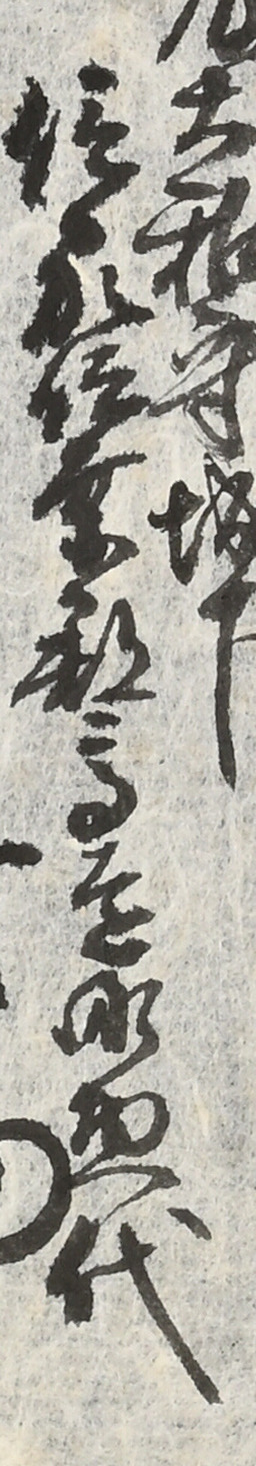信州伊奈郡高遠町惣代
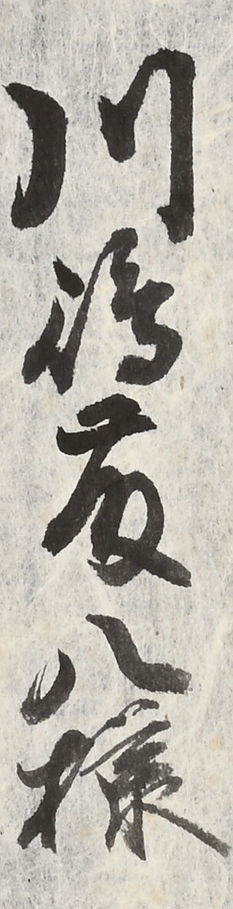川嶋藤八様
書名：乍恐以書付御訴訟申上候御事
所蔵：伊那市立高遠町図書館・合同会社AMANE
